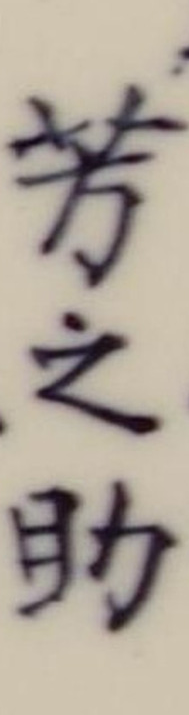芳之助
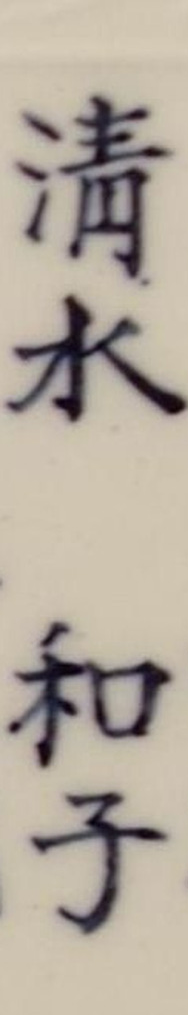清水和子
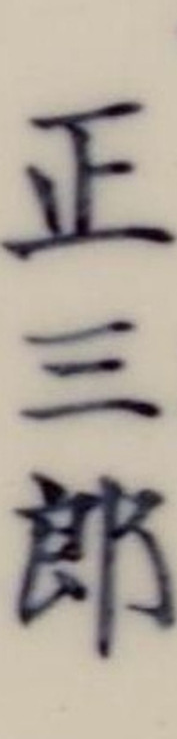正三郎
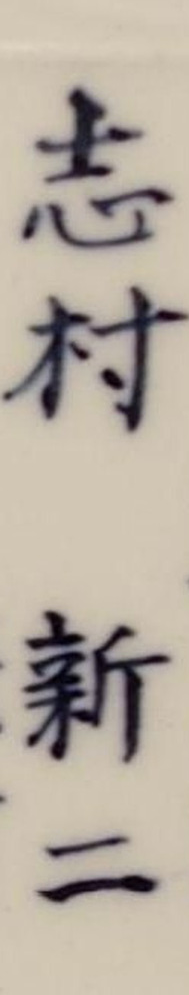志村新二
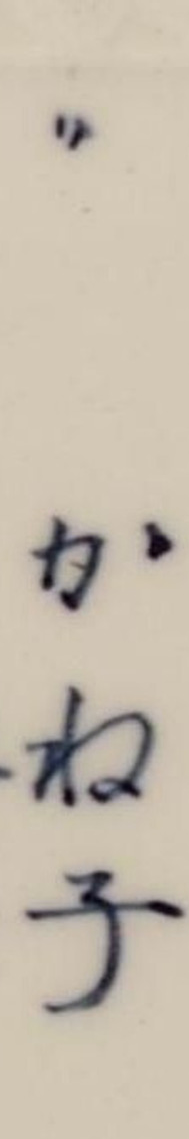かね子
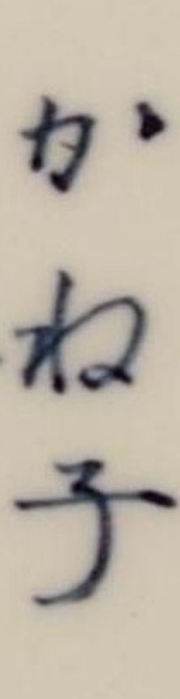かね子
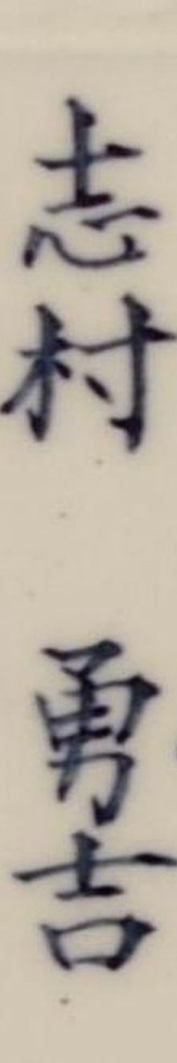志村勇吉
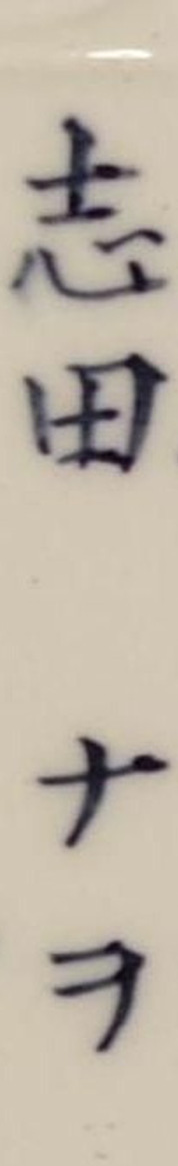志田ナヲ
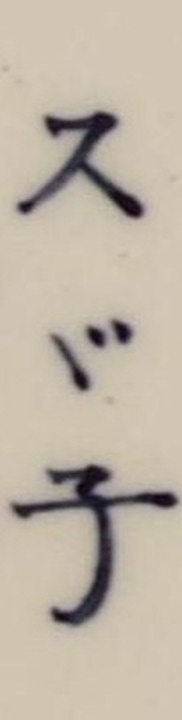スヾ子
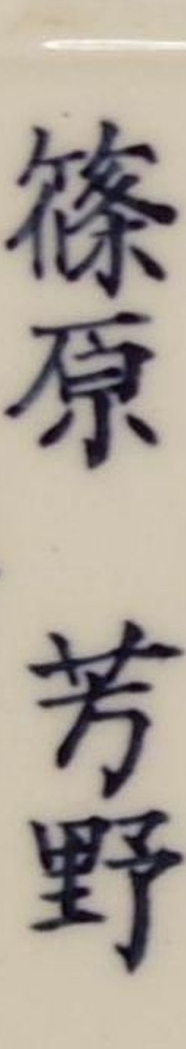篠原芳野
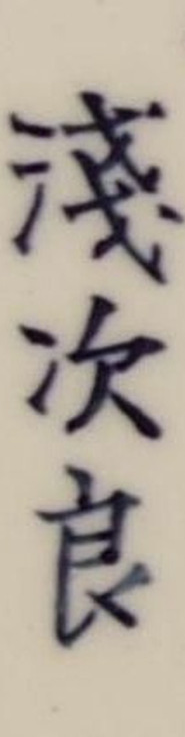浅次良
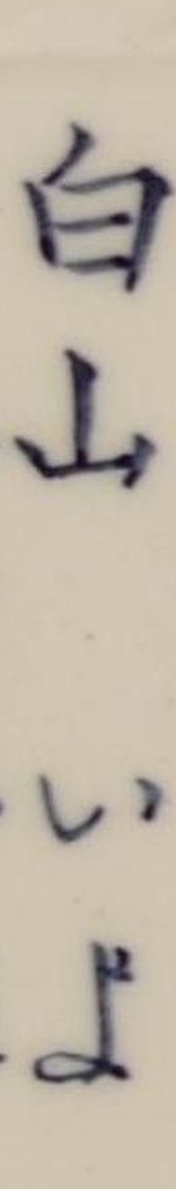白山いよ
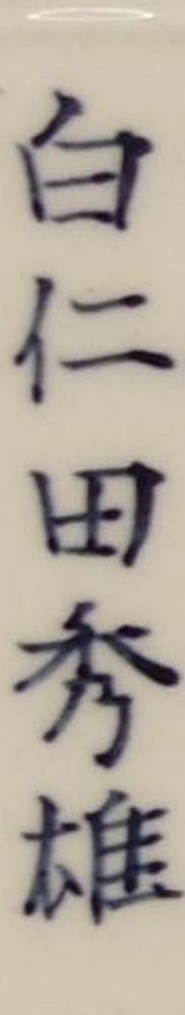白仁田秀雄
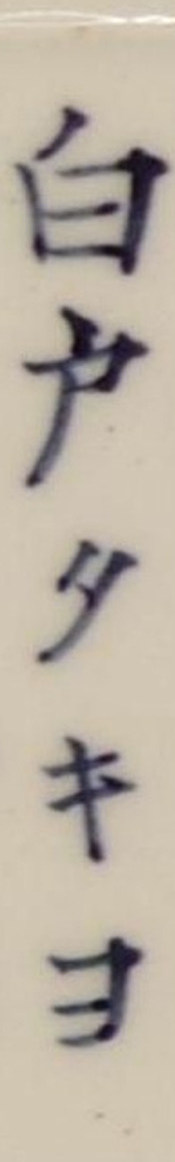白戸タキヨ
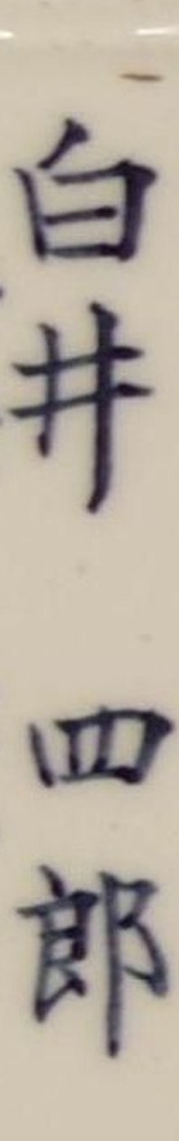白井四郎
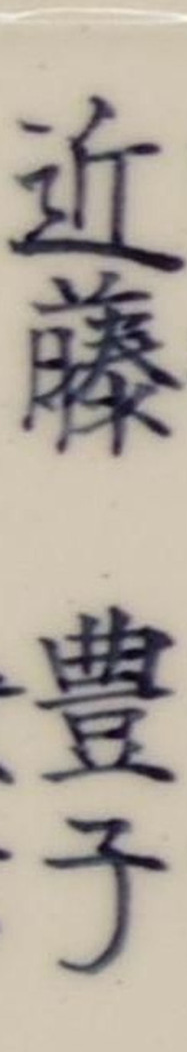近藤豊子
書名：E~L
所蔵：高野山金剛峯寺
